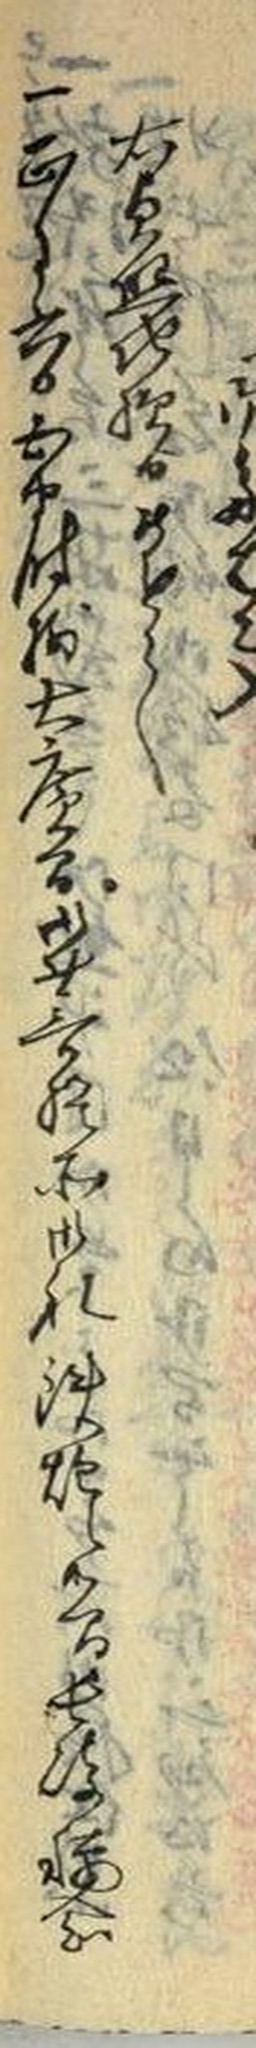一正月六日五半時揃大広間御菩提所御礼鉄炮之御間長崎称念
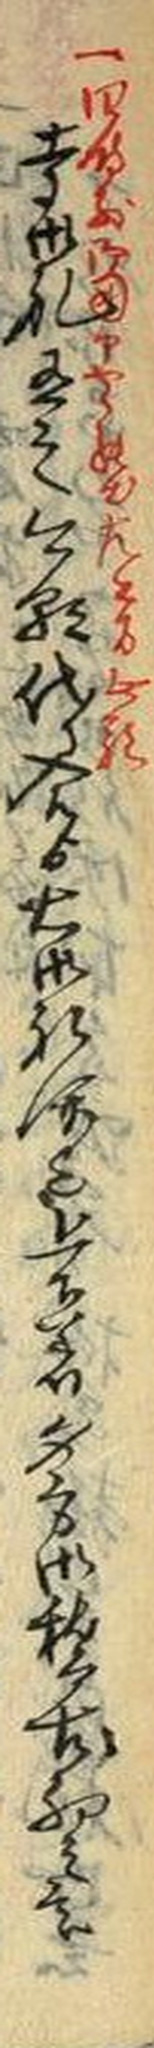寺御礼有之今朝代り合ゟ右御礼済迄上下着夕方御稽古初之節
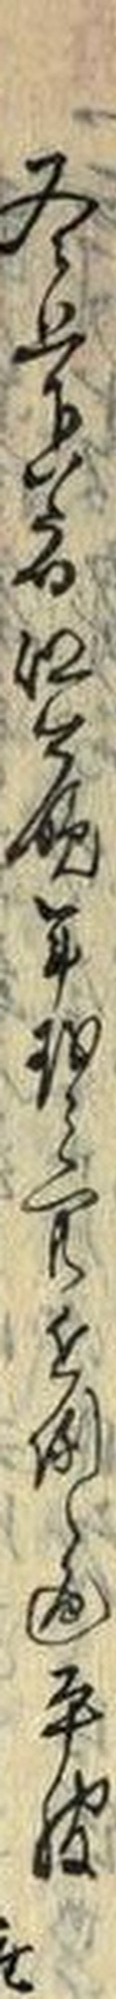又々上下着但今晩年越ニ候へ共近例之通平服
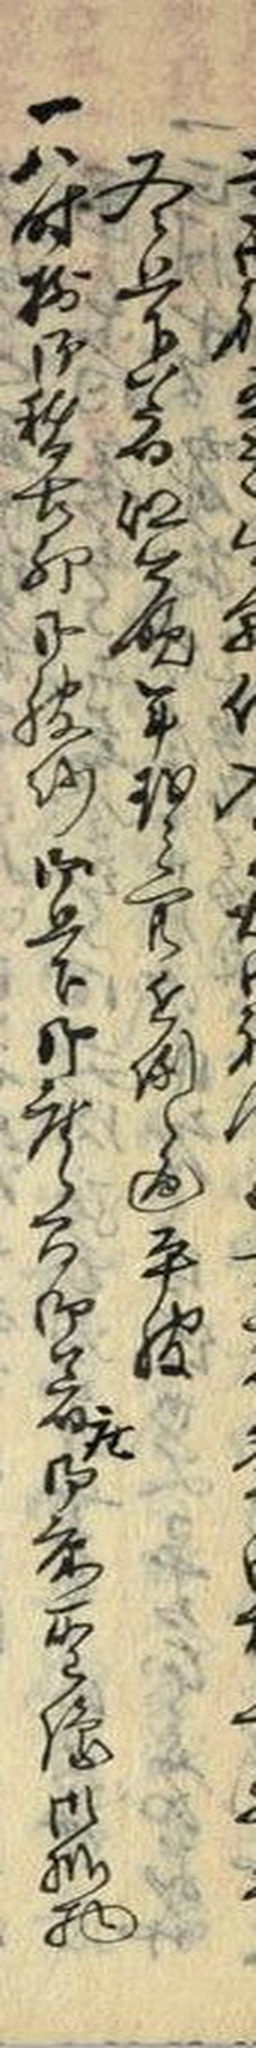一八時揃御稽古初御服紗御上下御座之間御着座御床聖像御掛物
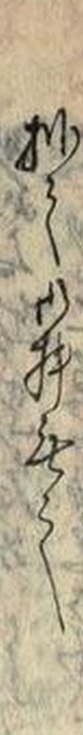掛之御拝無之
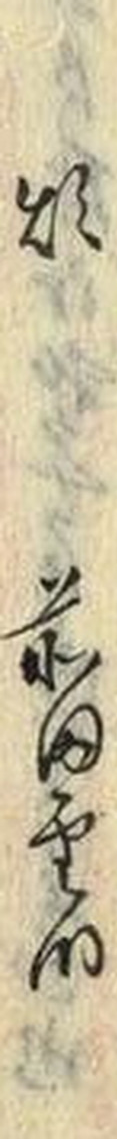煩前田雲洞
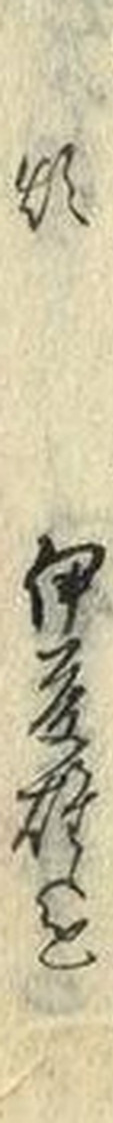煩伊藤雄之進
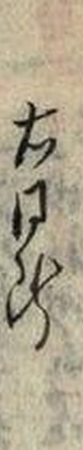右同断
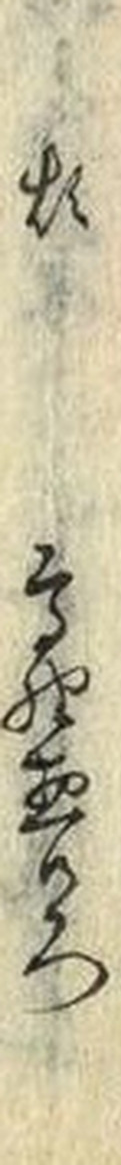煩高野惣左衛門
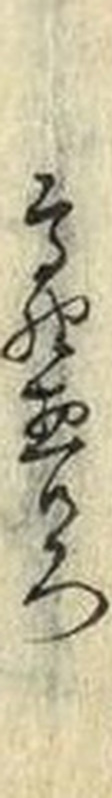煩高野惣左衛門
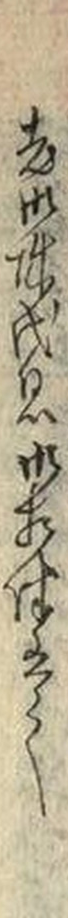老御城代息御相伴有之
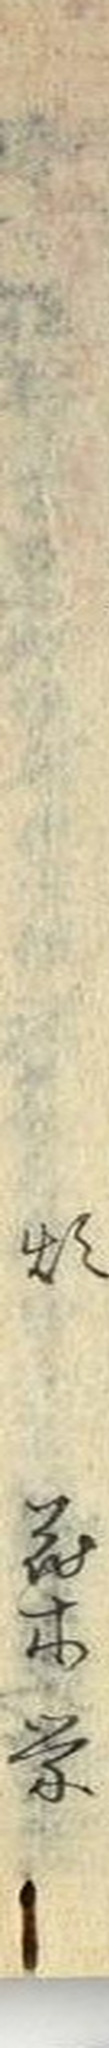煩花木栄
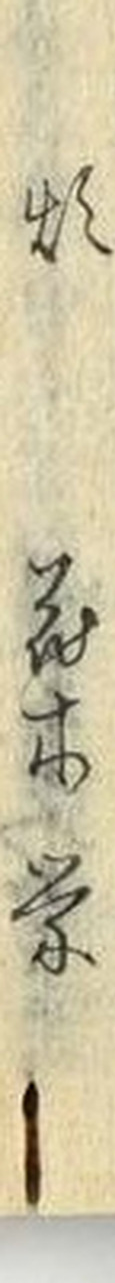煩花木栄
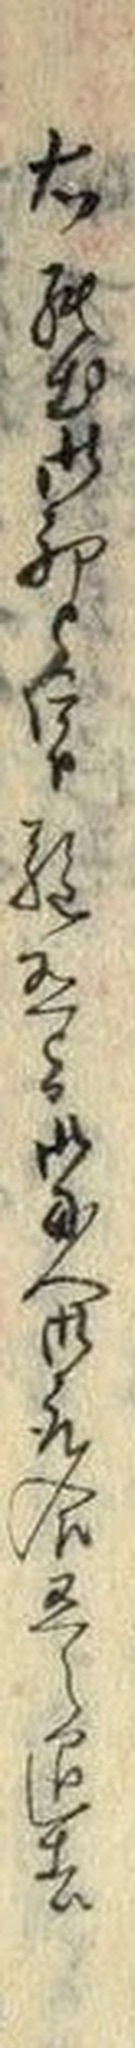右罷出御初被仰付難有旨御用人御取合有之退去
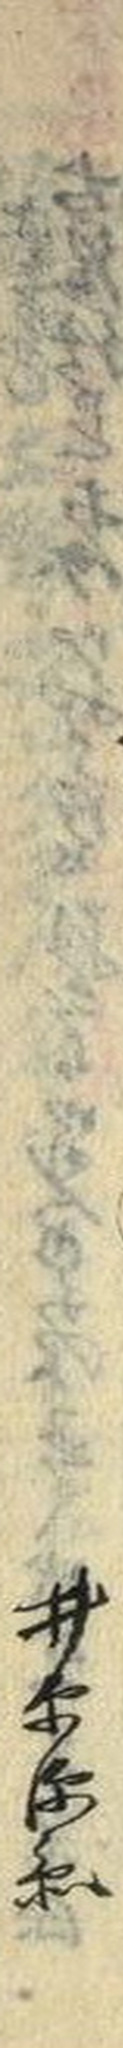井原源兵衛
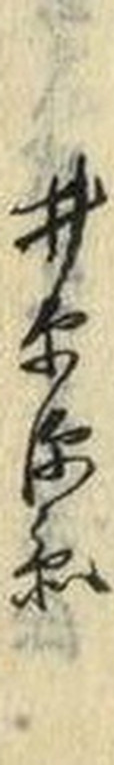井原源兵衛
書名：少傅日録抄（斉承付側向頭取日記、在国）
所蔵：福井県文書館 Fukui Prefectural Archives
